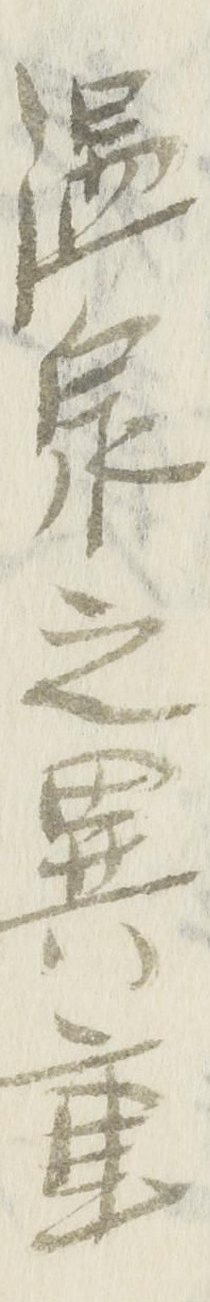温泉之異重
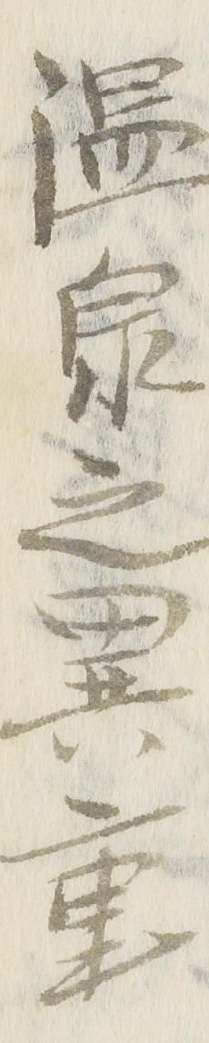温泉之異重
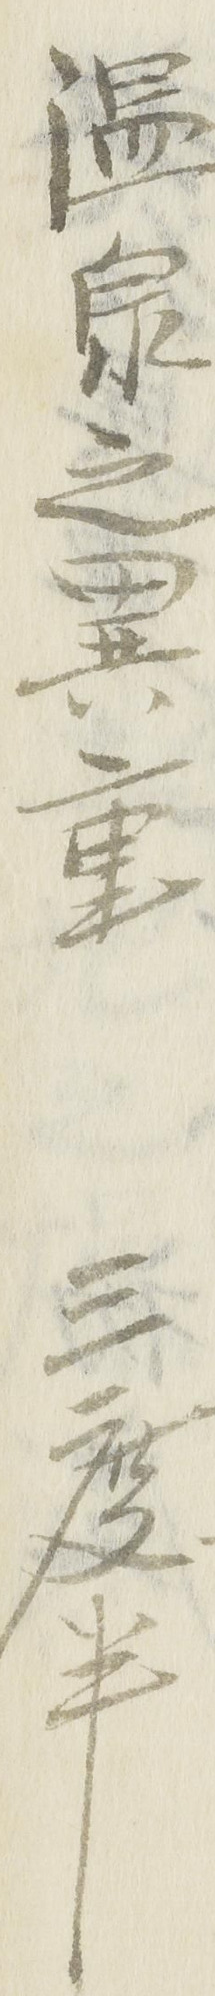温泉之異重三度半

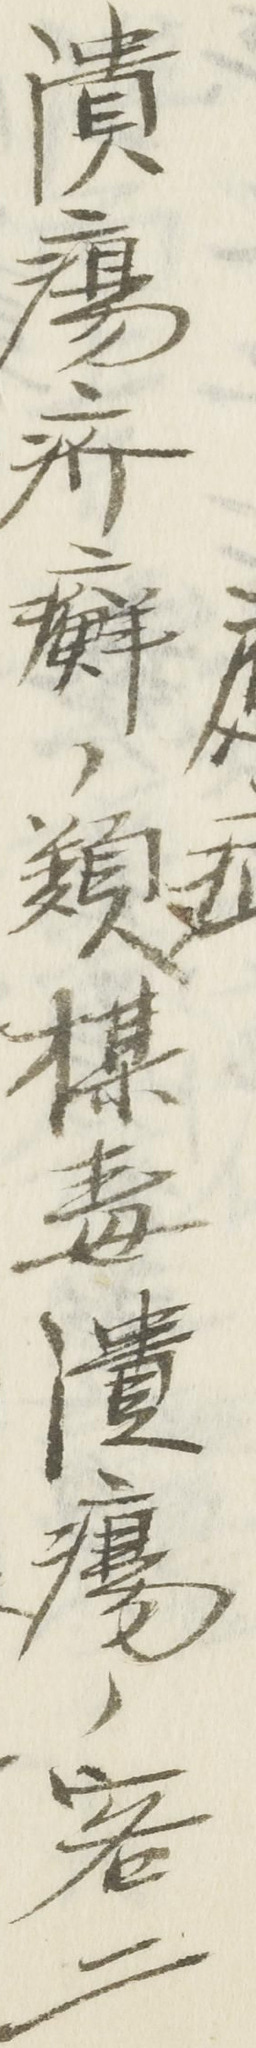潰瘍疥癬ノ類楳毒潰瘍ノ客ニ
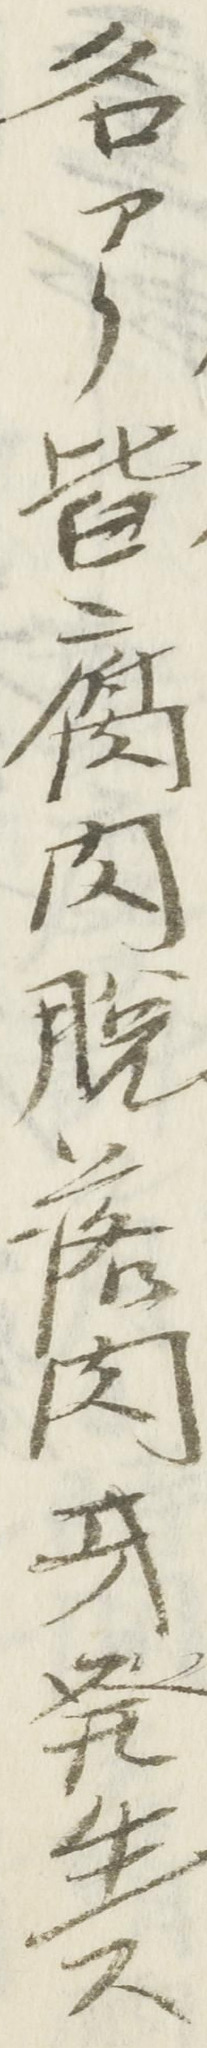名アリ皆腐肉脱落肉牙発生ス
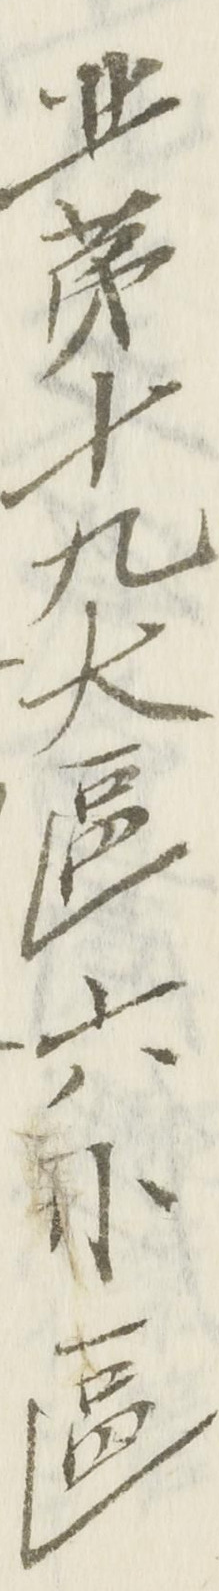北第十九大区六小区
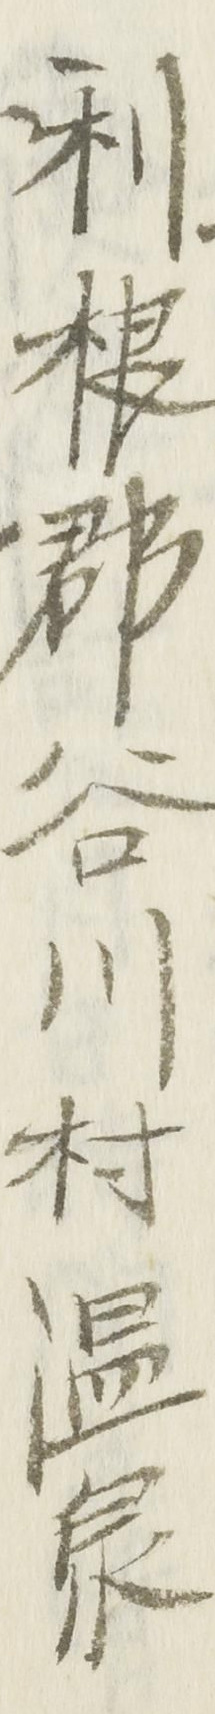利根郡谷川村温泉
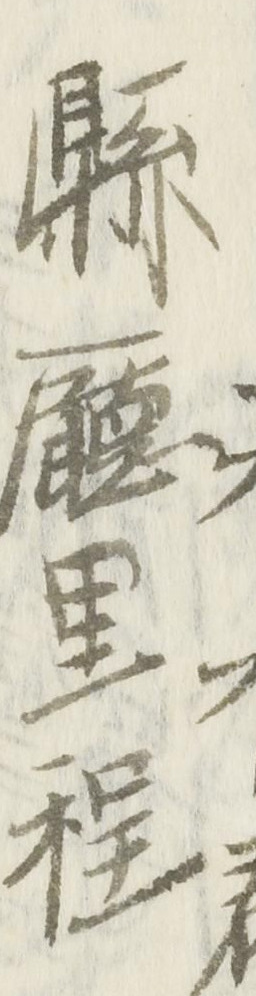県庁里程
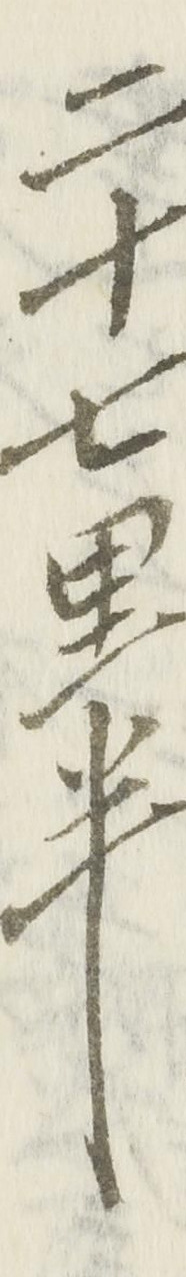二十七里半
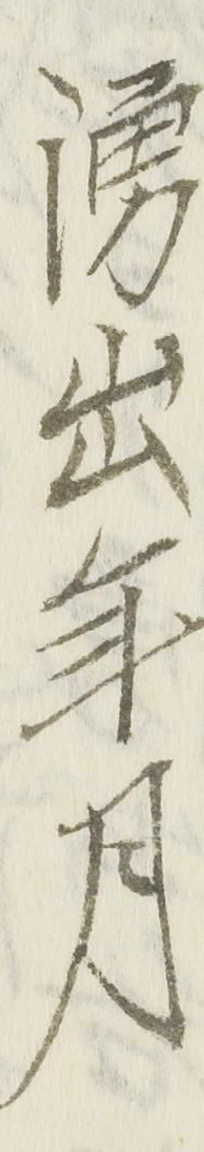湧出年月
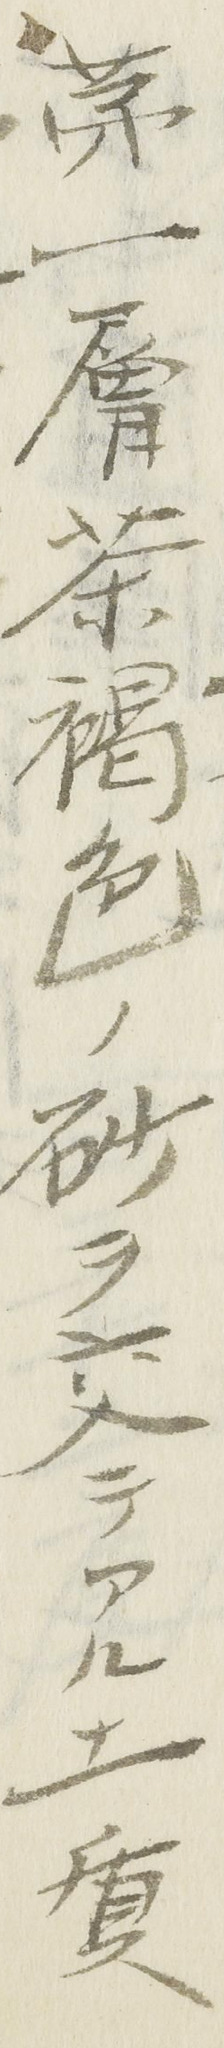第一層茶褐色ノ砂ヲ交テアル土質
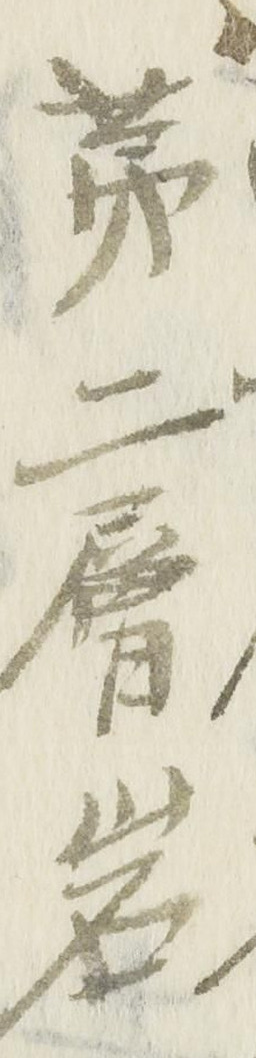第二層岩
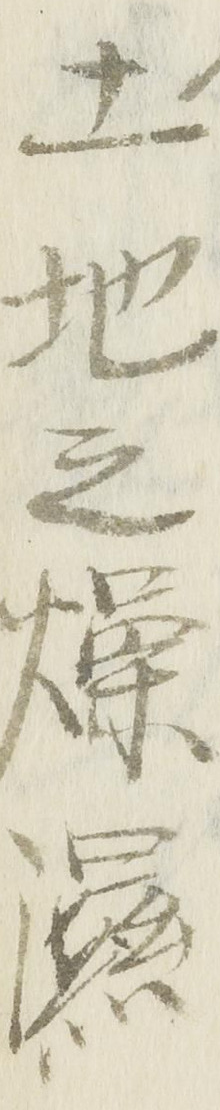土地之燥湿

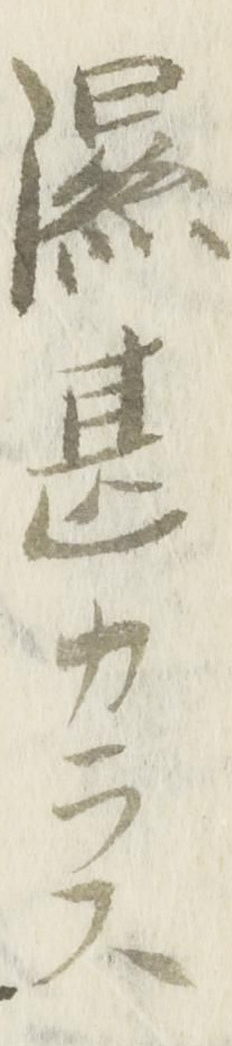湿甚カラス
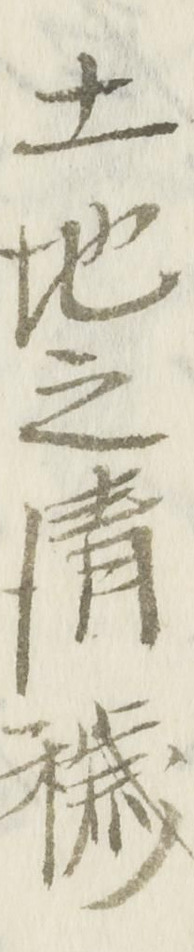土地之清穢
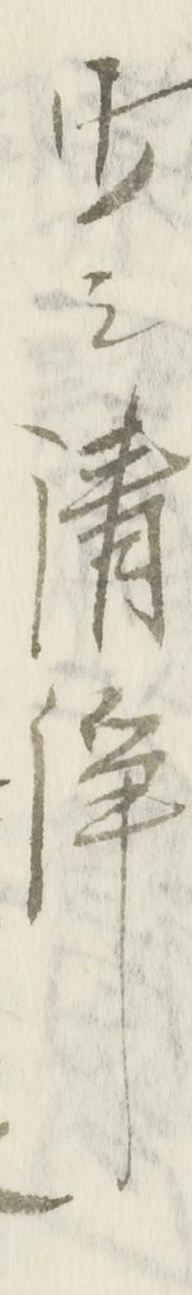少シ清浄
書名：温冷泉試験表
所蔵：東京大学地震研究所図書室 Earthquake Research Institute Library, The University of Tokyo, JAPAN
